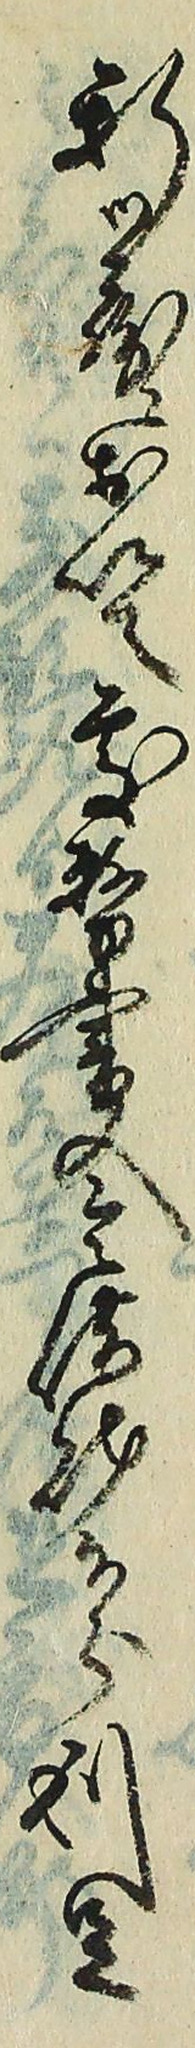新御蔵ニおいて處務書入令借財候分利足
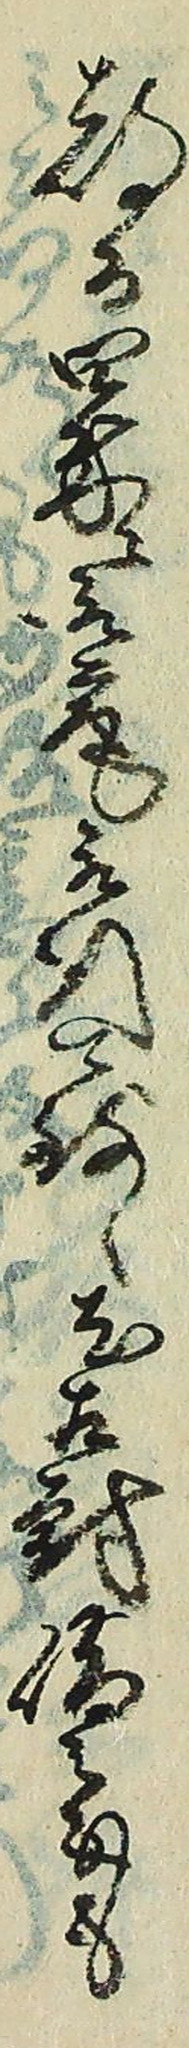都而晟ニ取究取引可致候尤相對借之義も
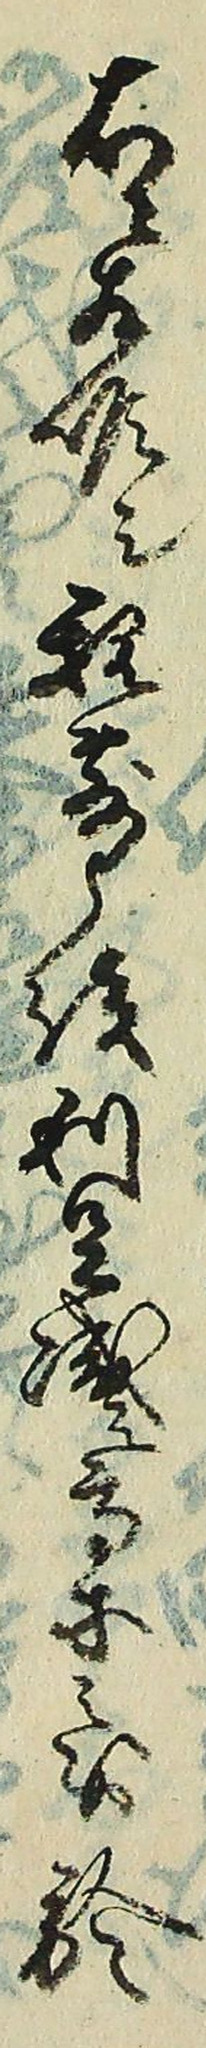右ニ相順シ親敷申談利足減之高等之義於
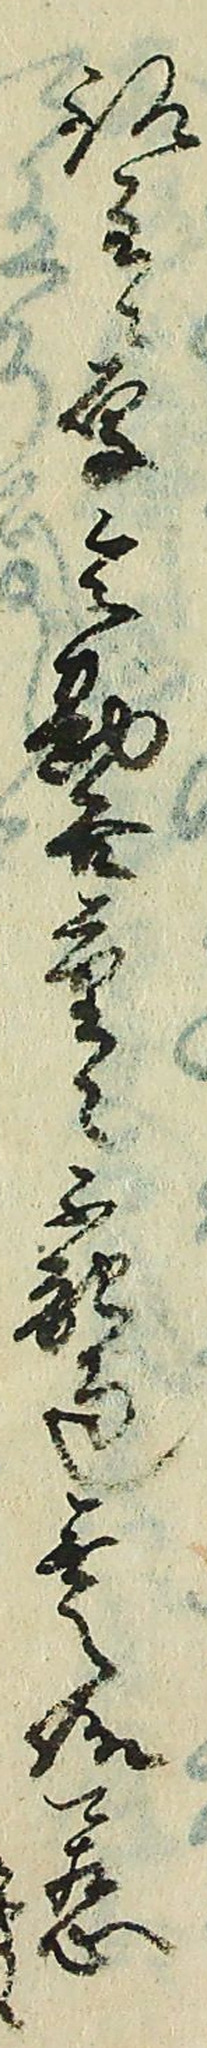銀主ニ厚令勘弁重々不融通無之様可相心得候
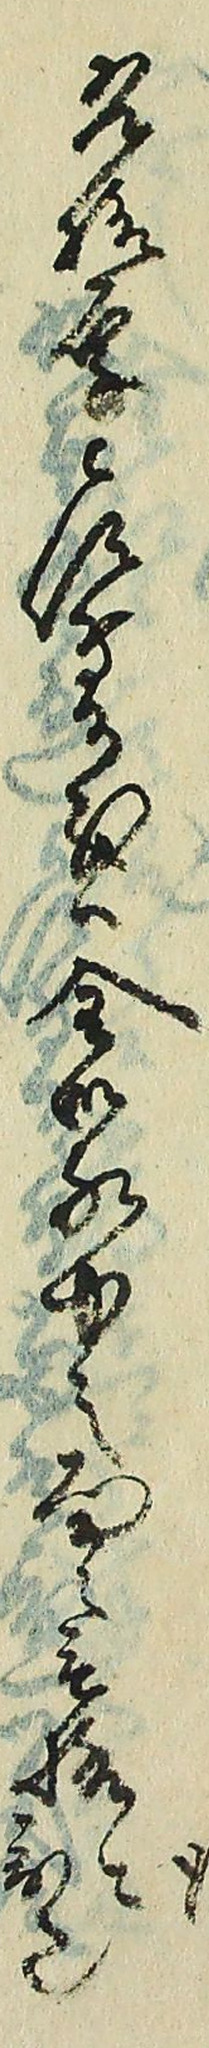右様厚被仰付候義ハ全御家中面々無格ニ至迄
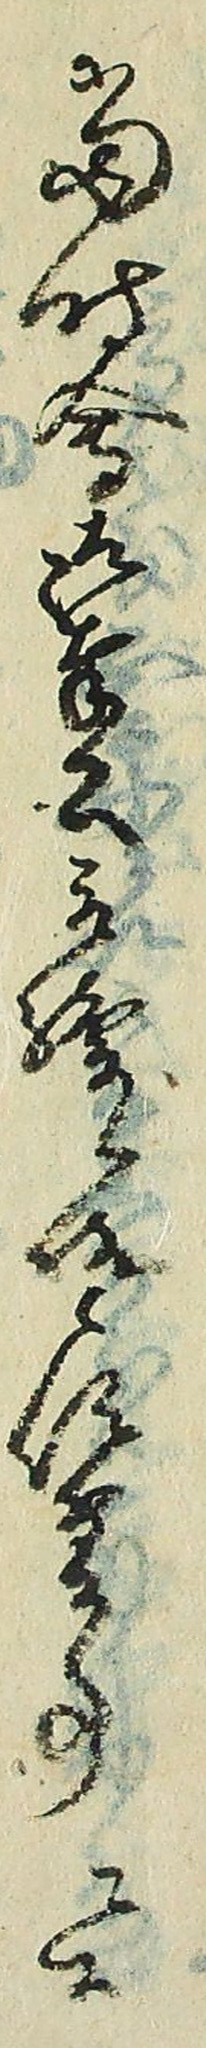當時會御奉公取續候様被仰付候事ニ候
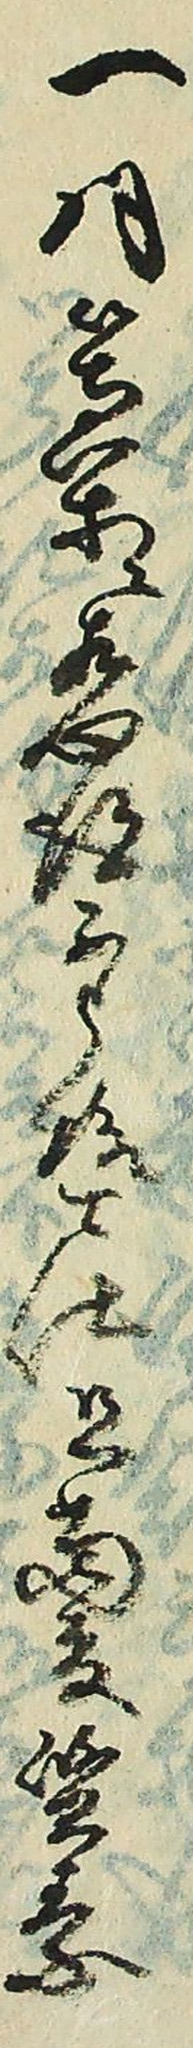一同等閑ニ相心得不申様可仕且當夏質素
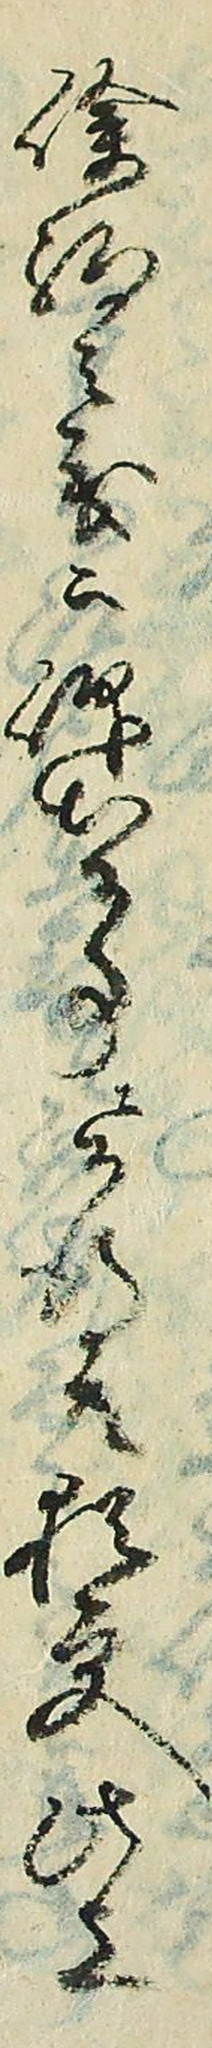倹約之義被仰出候事ニ候得共猶更此上
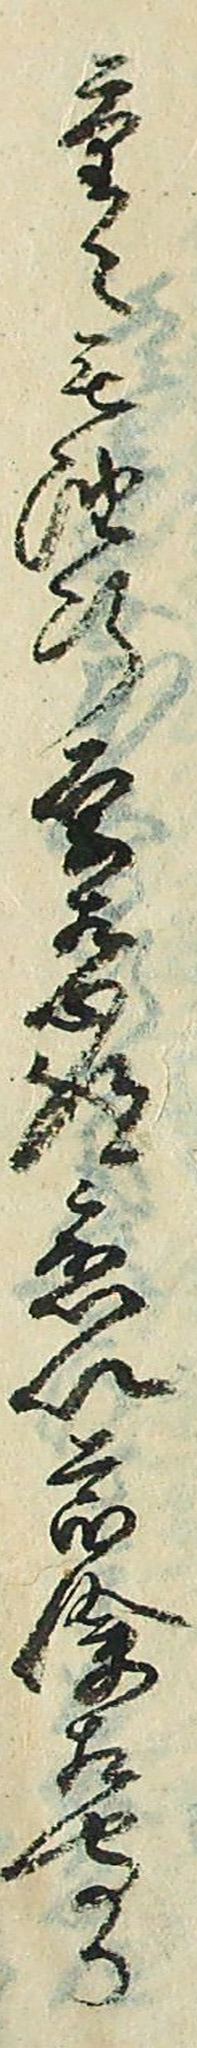重々無油断厚相心得愈以節倹相守り

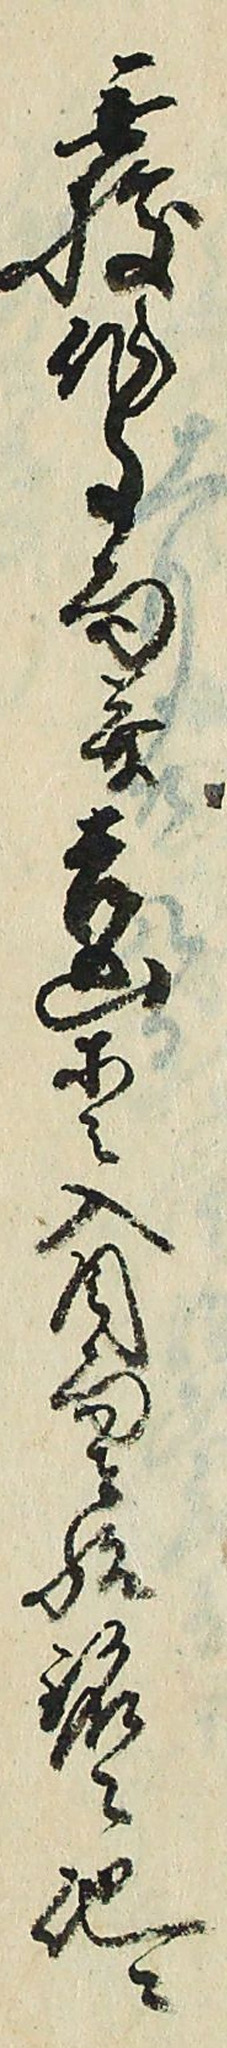無據作事向幷吉凶等之入目向を始銘々他ニ
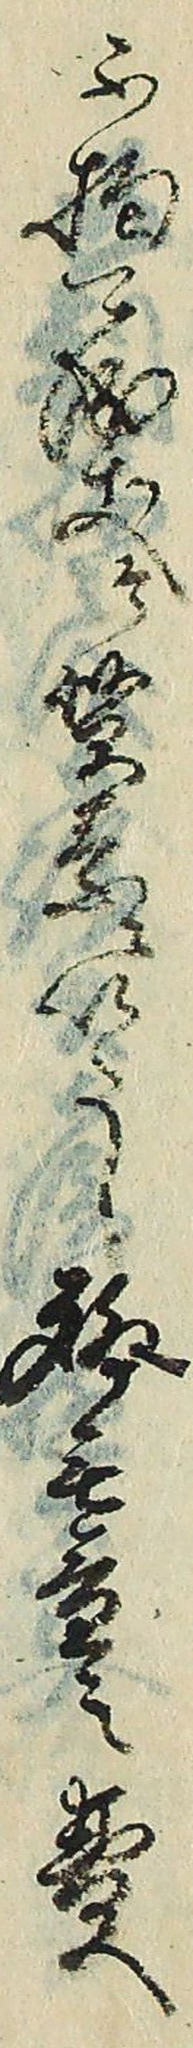不拘可成丈ケ質素ニいたし聊無益之費
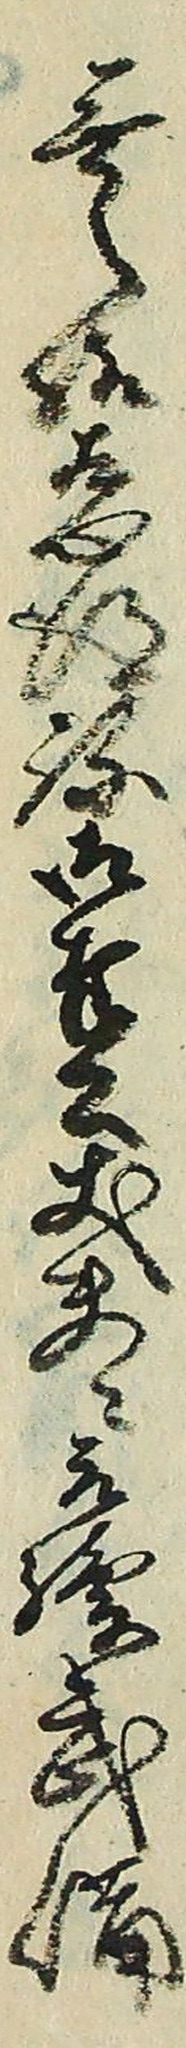無之様相心得弥御奉公丈夫ニ取續武備
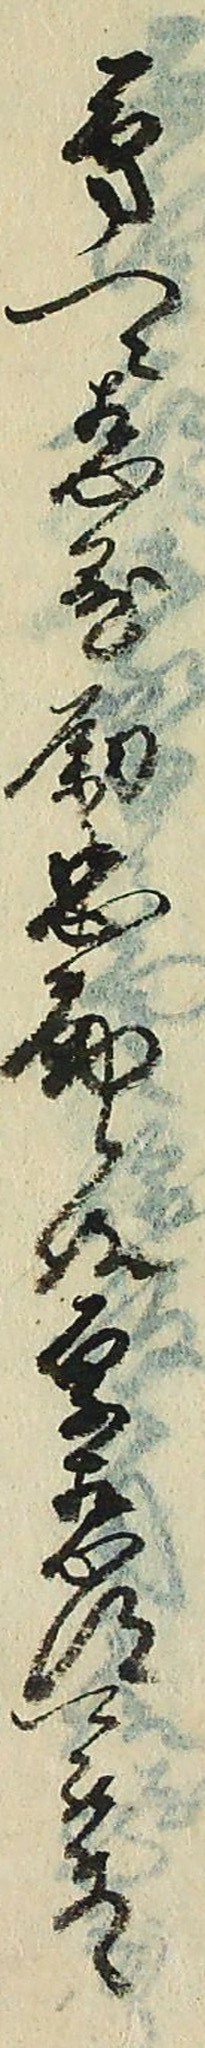第一ニ相心懸励忠勤候様厚相心得可罷在候
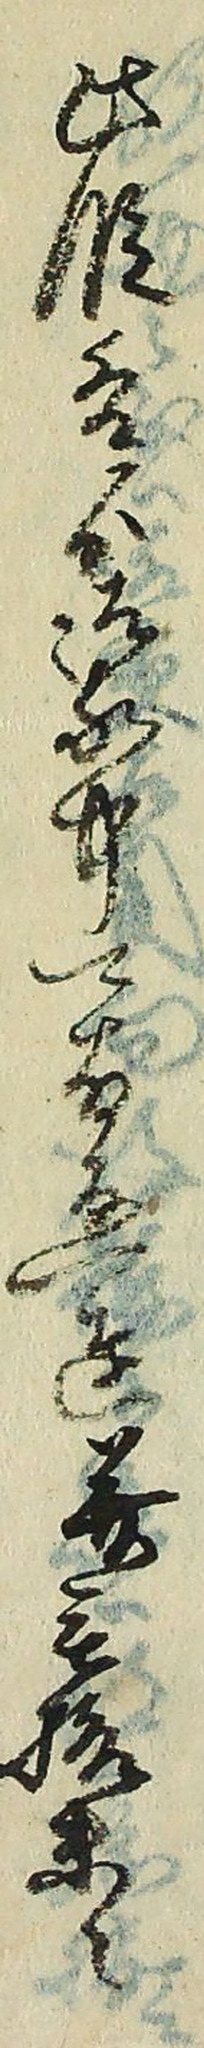此段各ゟ御家中可有通達幷無格末々
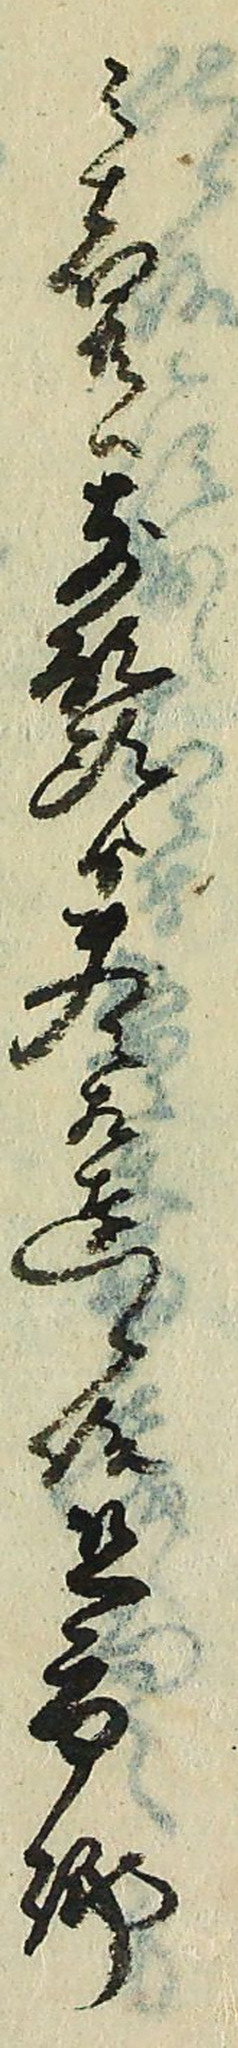之者共ハ支配頭ゟ夫々相達候様且市郷
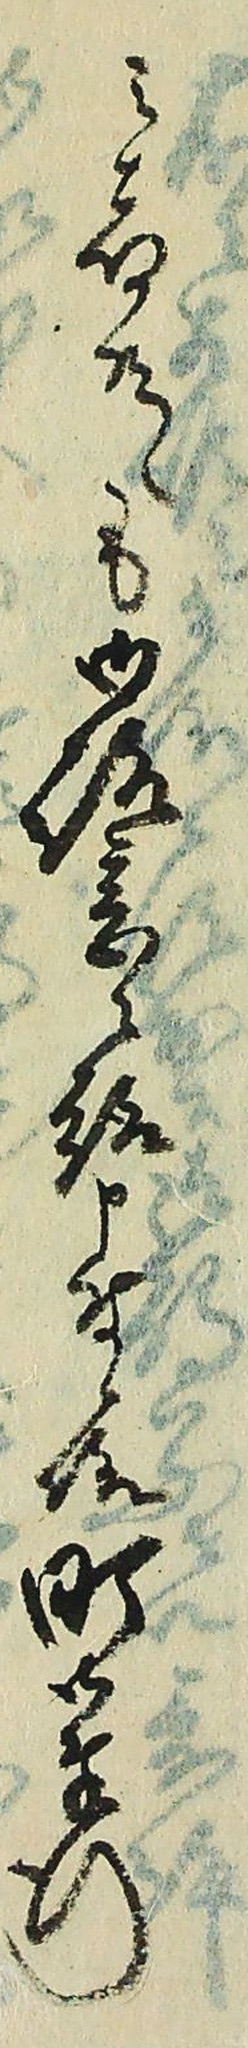之者共へも御趣意之趣申付候様町御奉行
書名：諸御趣意書并御下知向之写
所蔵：鳴門教育大学 Naruto University of Education
